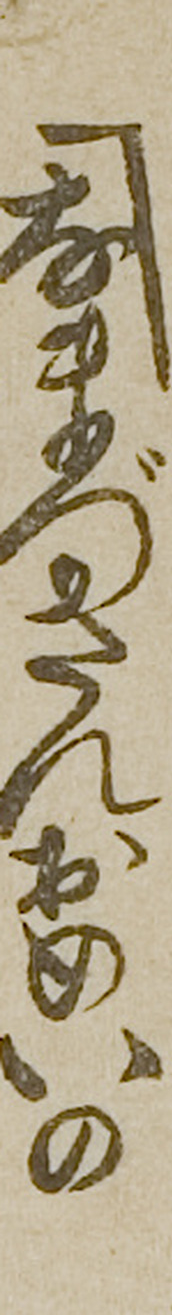〽なまづさんおめいの
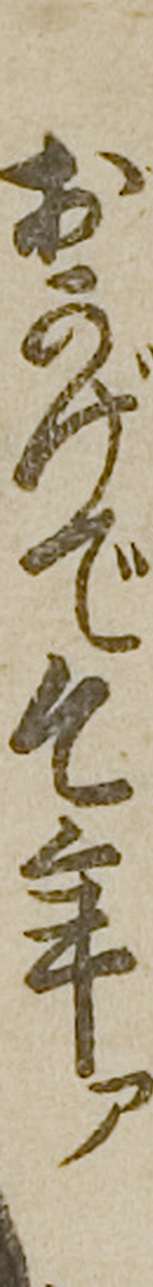おかげで今年ぁ
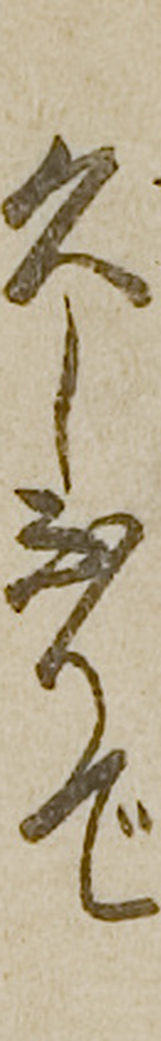久しふりで
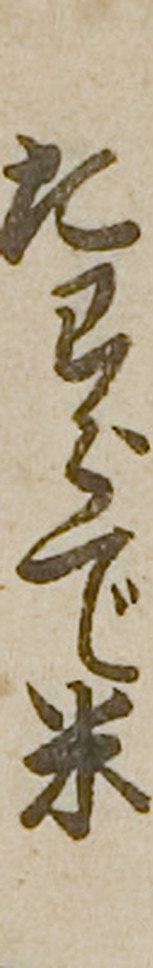たわらで米
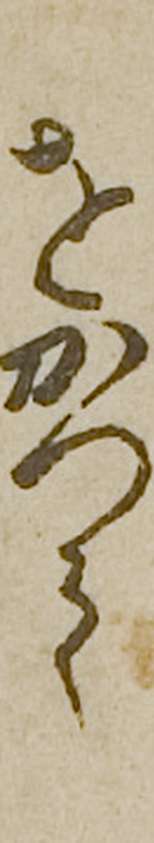をかつて
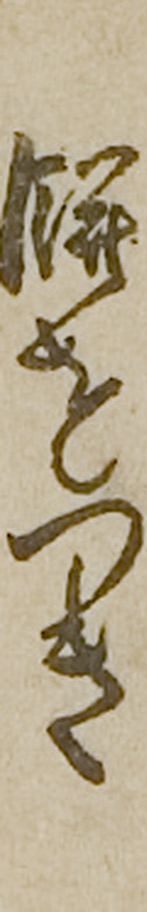餅をつき
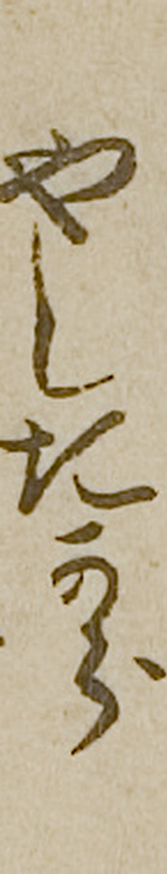やしたから
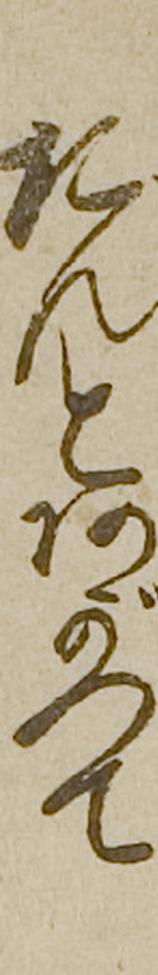たんとあがつて
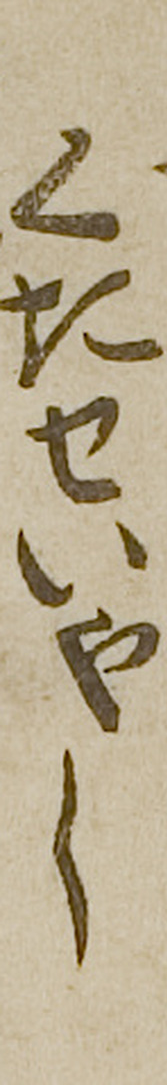くたせいやし
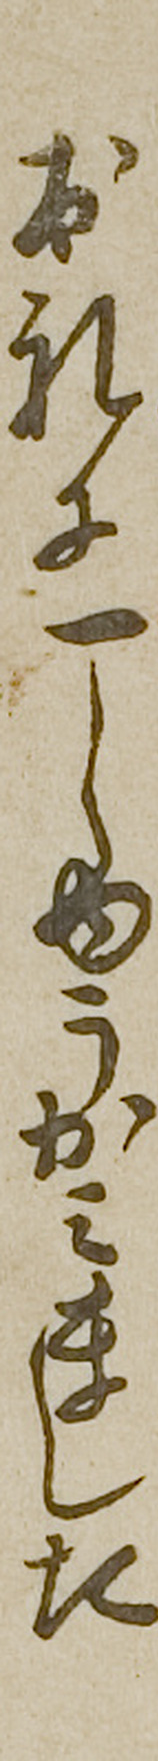お礼に一しゆうかみました
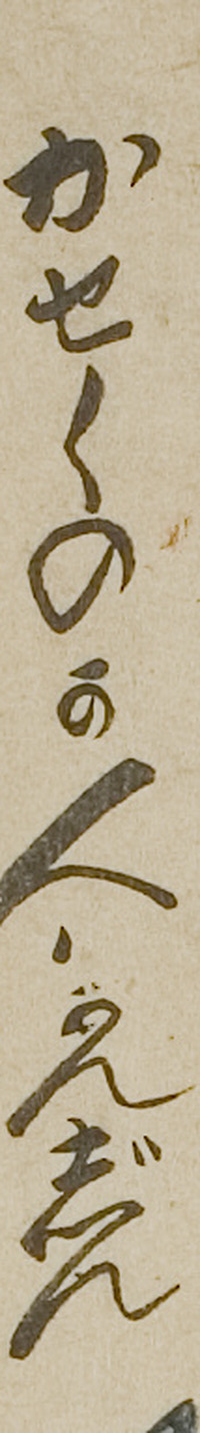かせくのか人はかんじん
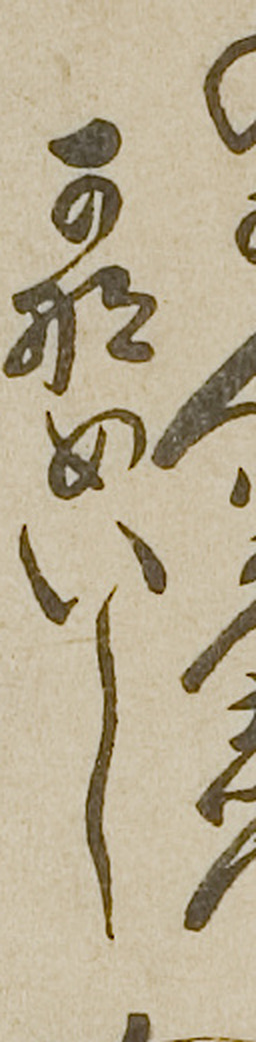かなめいし
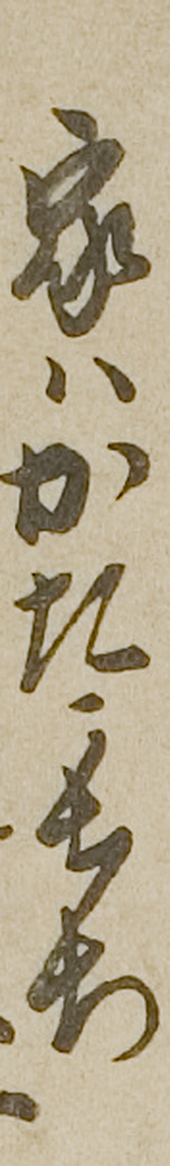家はかたもち
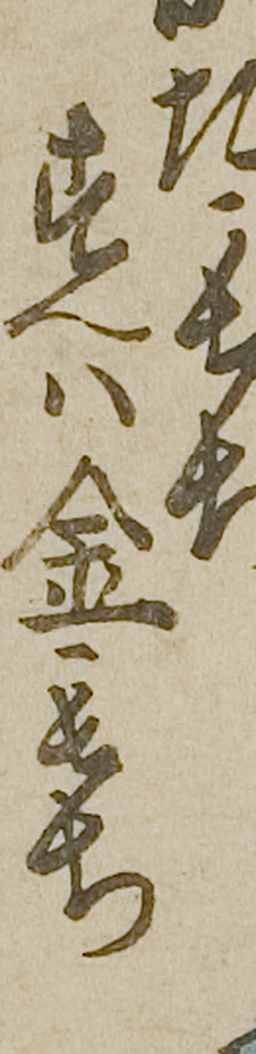すへは金もち
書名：三職よろこび餅
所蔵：東京大学総合図書館 General Library in the University of Tokyo, JAPAN
